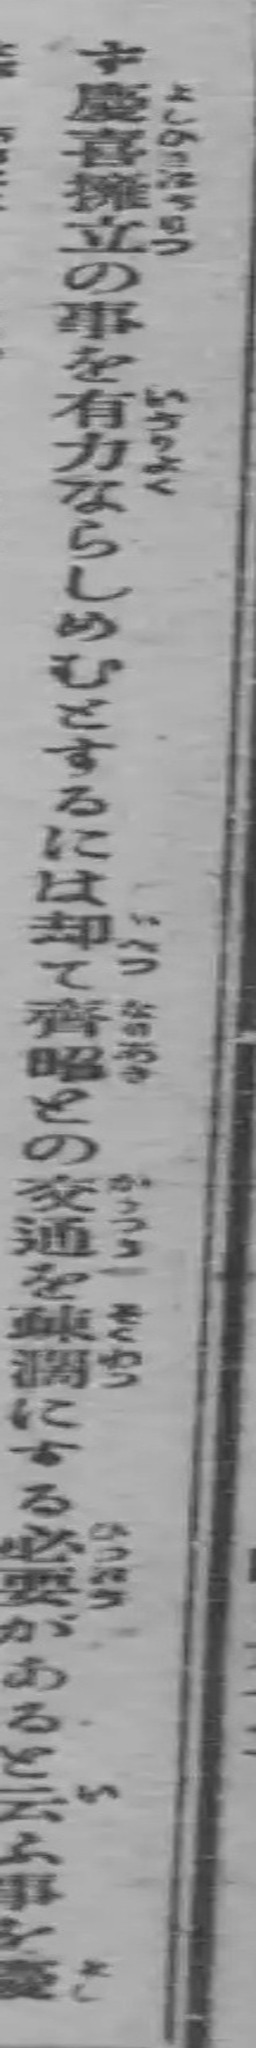ず慶喜擁立の事を有力ならしめむとするには却て斉昭との交通を疎闊にする必要があると云ふ事を慶
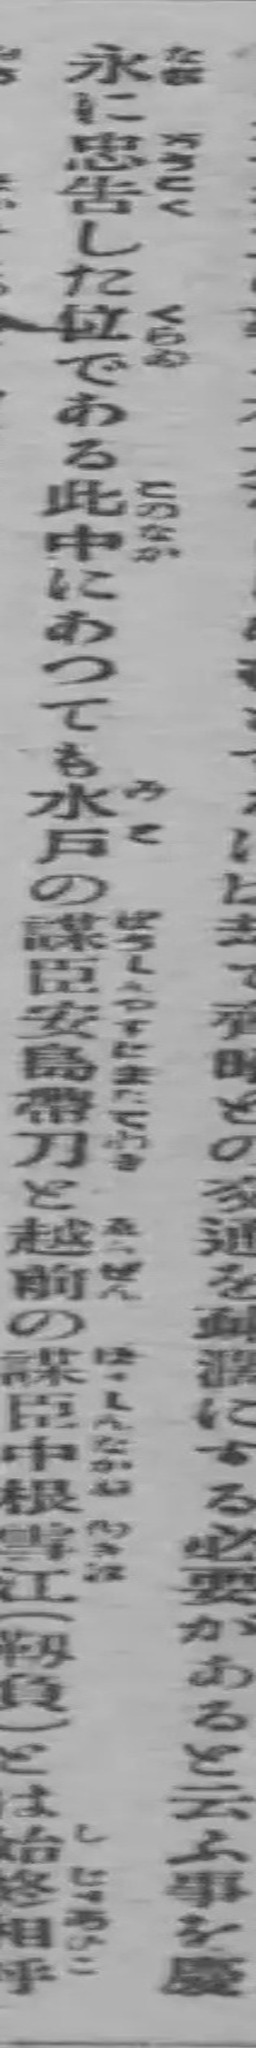永に忠告した位である此中にあつても水戸の謀臣安島帯刀と越前の謀臣中根雪江(靱負)とは始終相呼
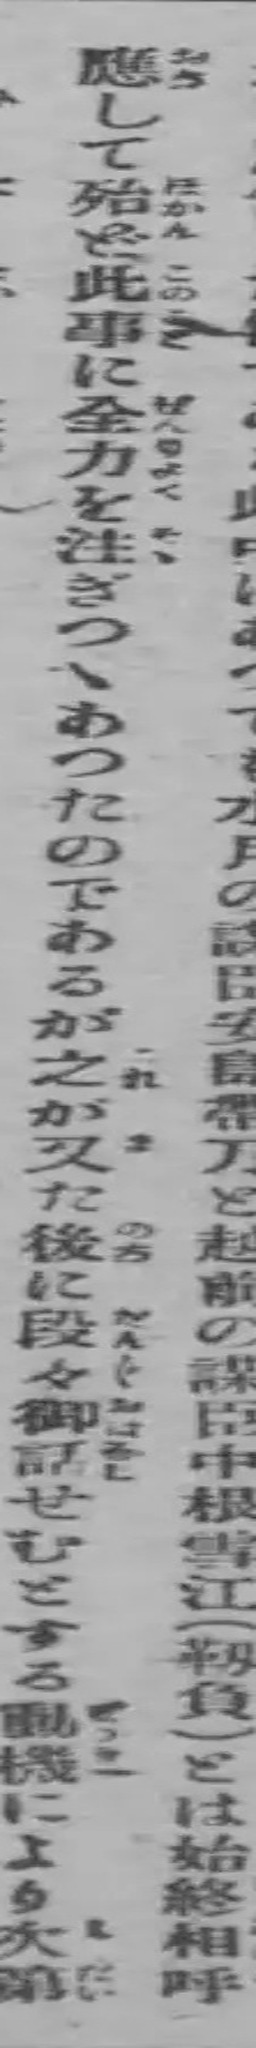応して殆ど此事に全力を注ぎつゝあつたのであるが之が又た後に段々御話せむとする動機により次第
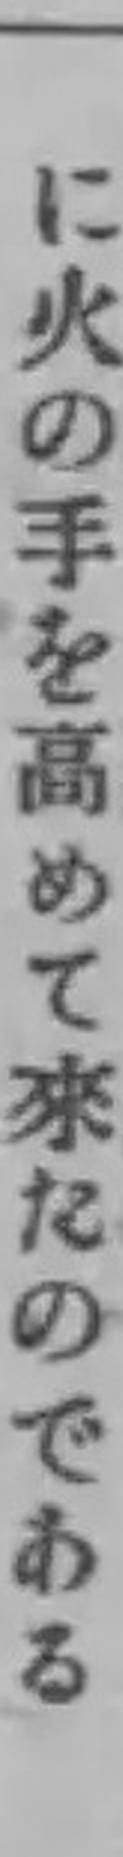に火の手を高めて来たのである
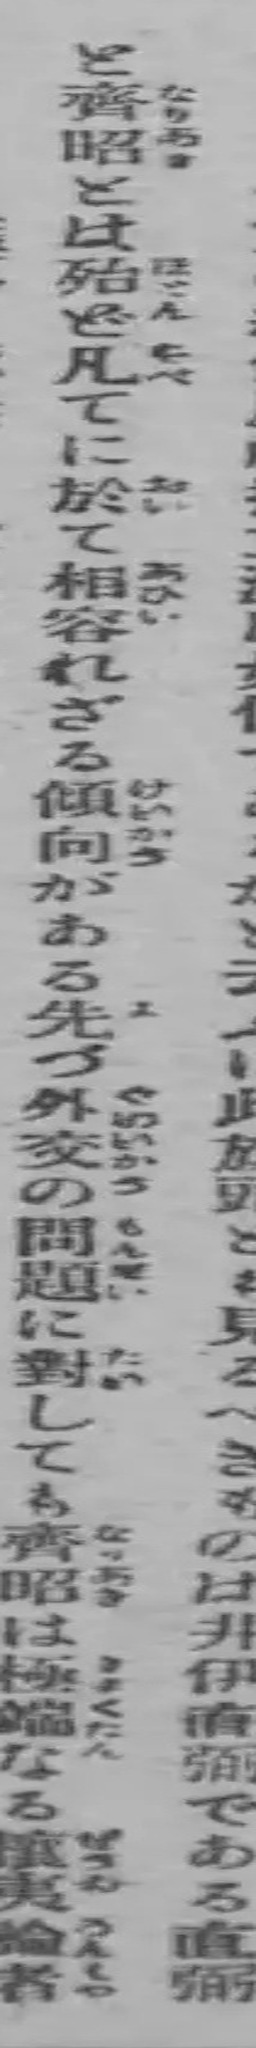と斉昭とは殆ど凡てに於て相容れざる傾向がある先づ外交の問題に対しても斉昭は極端なる攘夷論者
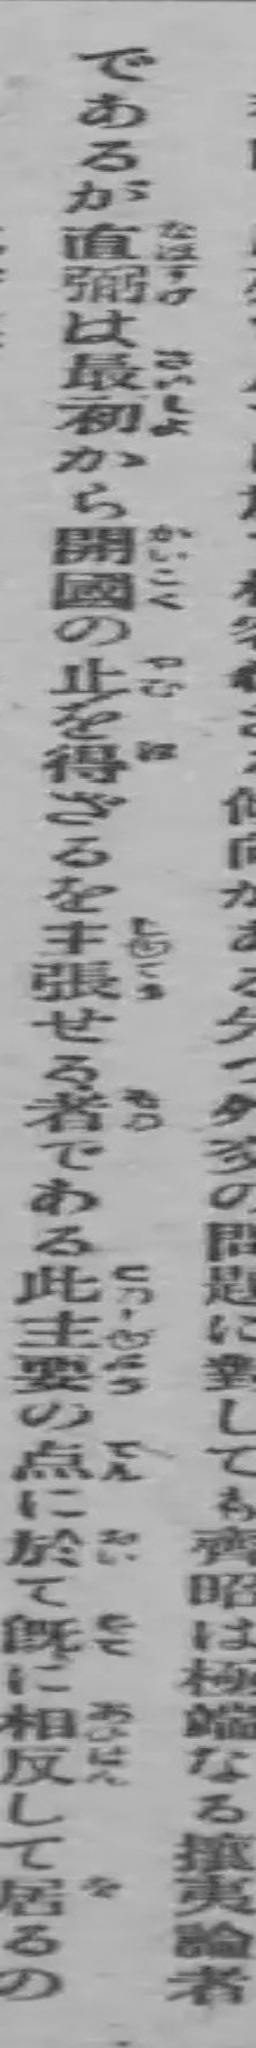であるが直弼は最初から開国の止を得ざるを主張せる者である此主要の点に於て既に相反して居るの
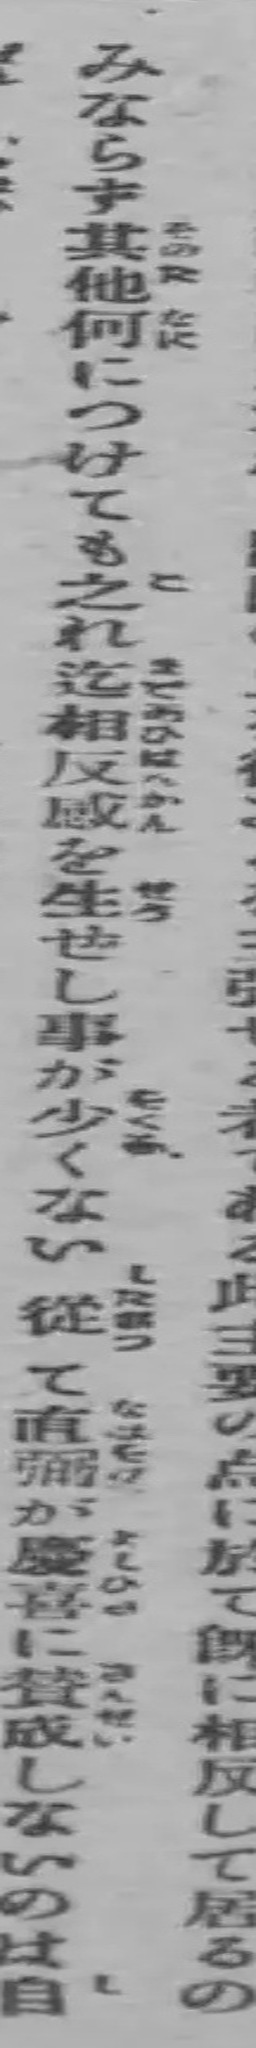みならず其他何につけても之れ迄相反感を生ぜし事が少くない従て直弼が慶喜に賛成しないのは自
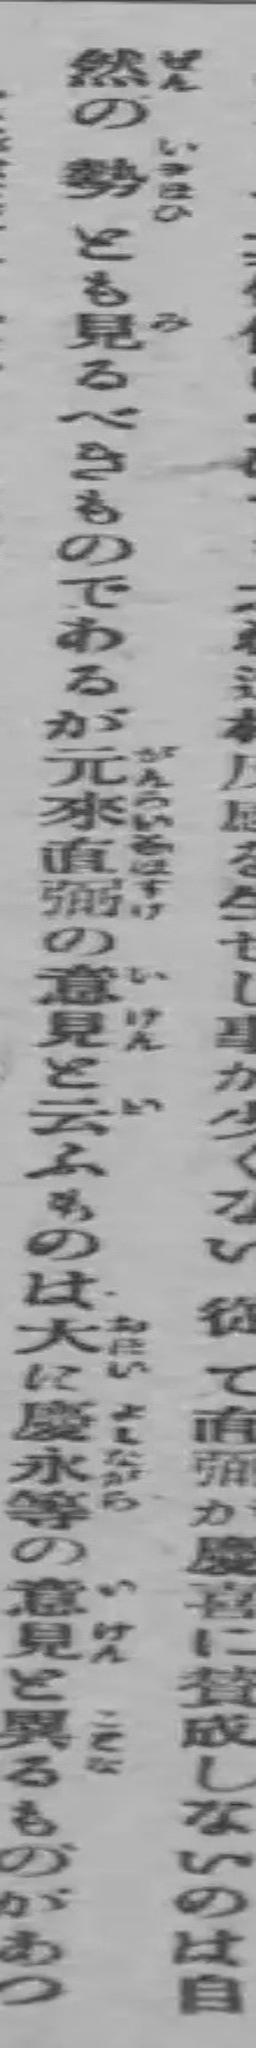然の勢とも見るべきものであるが元来直弼の意見と云ふものは大に慶永等の意見と異るものがあつ
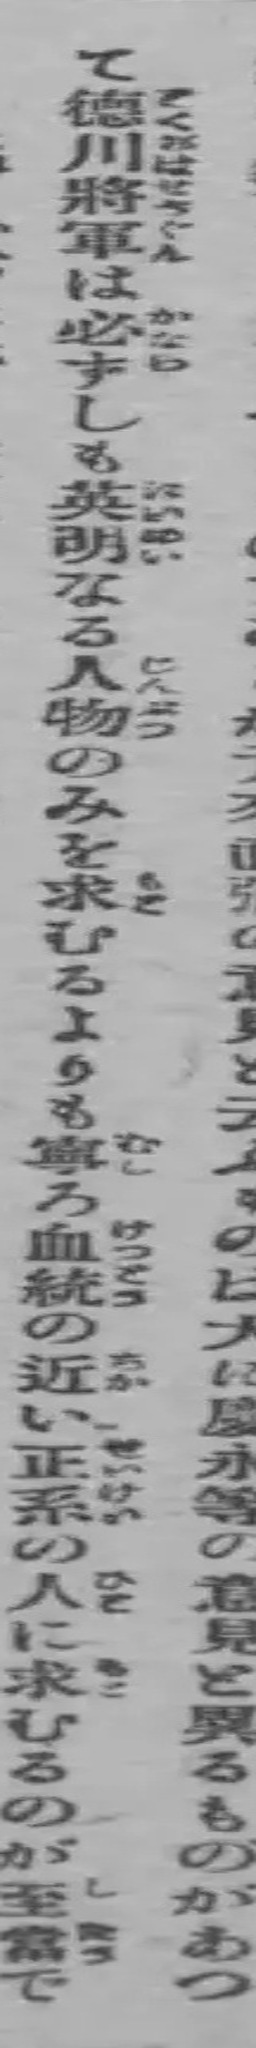て徳川将軍は必ずしも英明なる人物のみを求むるよりも寧ろ血統の近い正系の人に求むるのが至当で
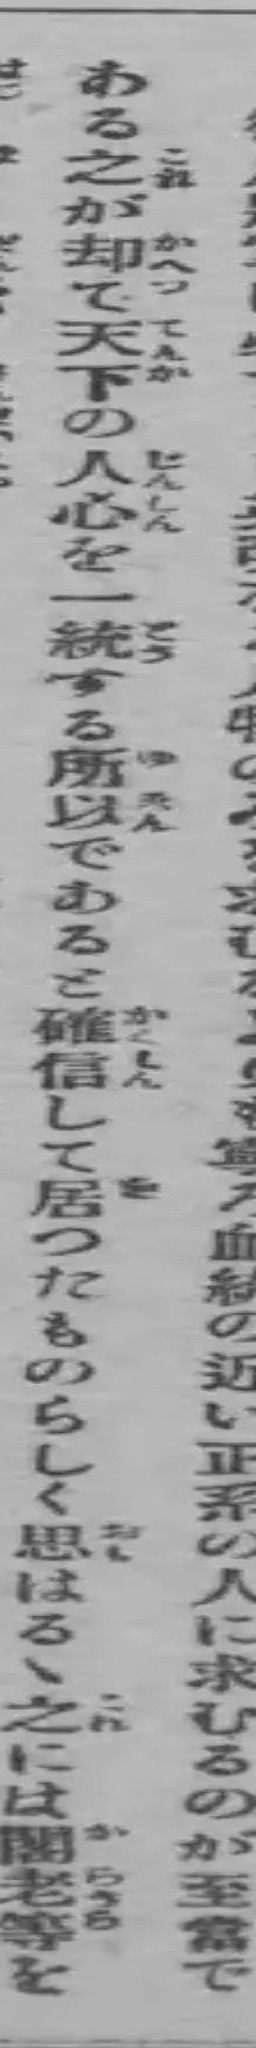ある之が却て天下の人心を一統する所以であると確信して居つたものらしく思はるゝ之には閣老等を
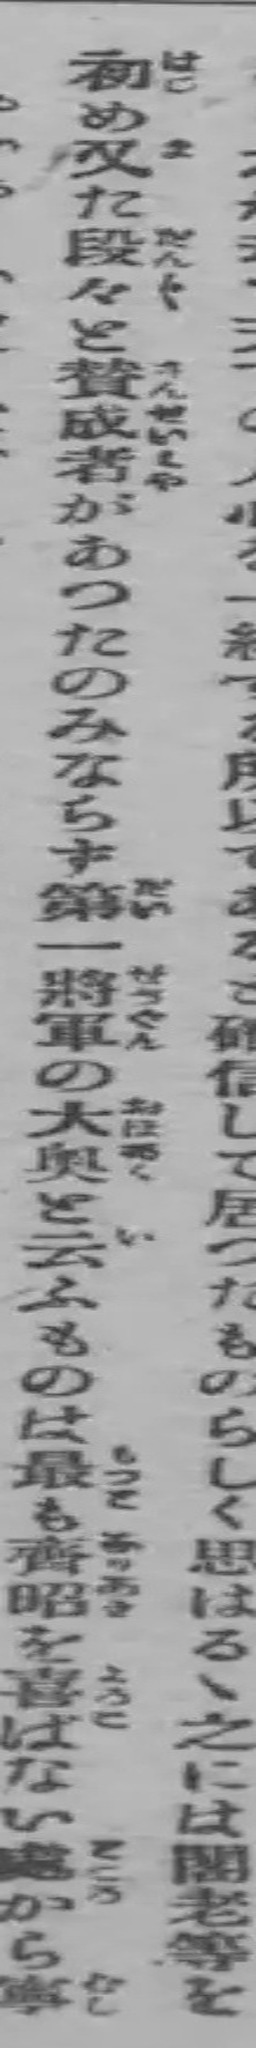初め又た段々と賛成者があつたのみならず第一将軍の大奥と云ふものは最も斉昭を喜ばない処から寧
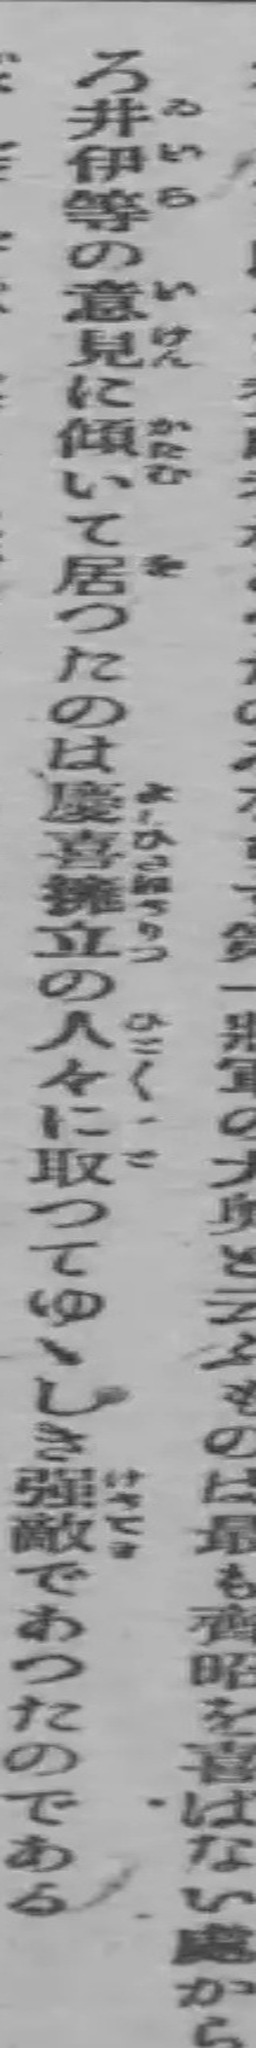ろ井伊等の意見に傾いて居つたのは慶喜擁立の人々に取つてゆゝしき強敵であつたのである
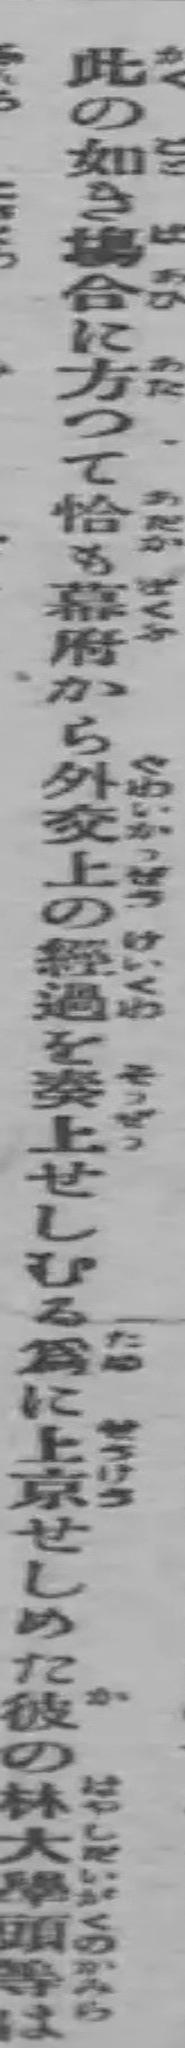此の如き場合に方つて恰も幕府から外交上の経過を奏上せしむる為に上京せしめた彼の林大学頭等は
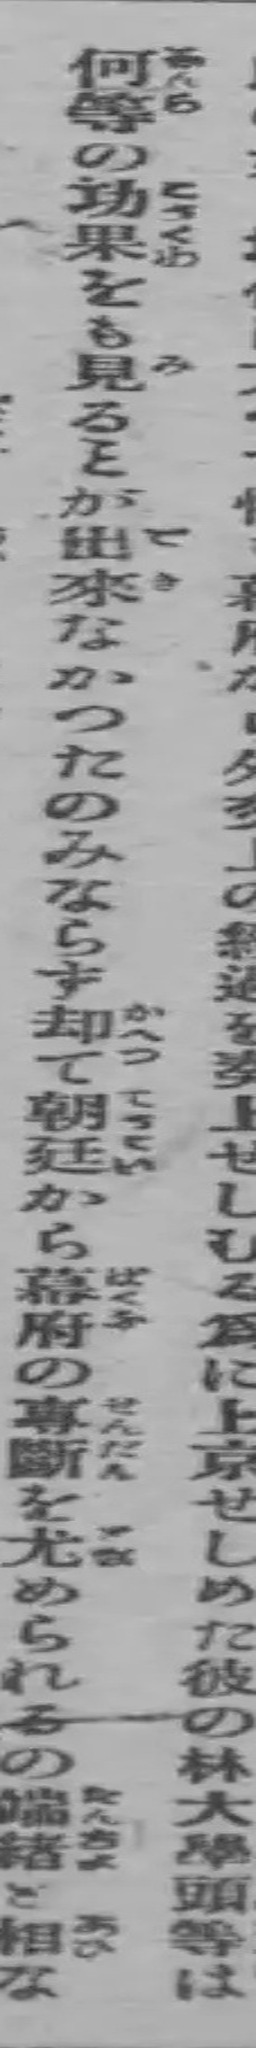何等の功果をも見ることが出来なかつたのみならず却て朝廷から幕府の専断を尤められるの端緒と相な
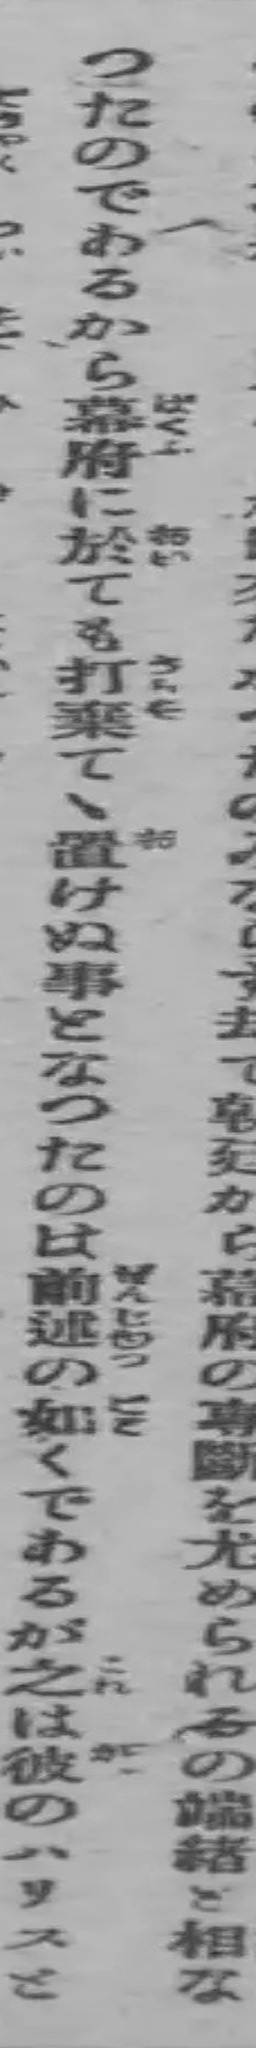つたのであるから幕府に於ても打棄てゝ置けぬ事となつたのは前述の如くであるが之は彼のハリスと
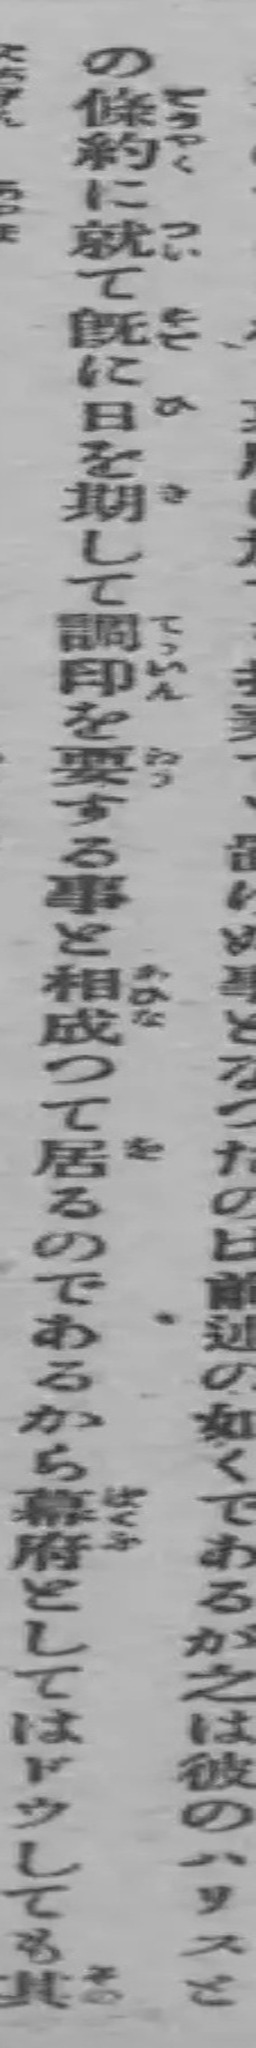の条約に就て既に日を期して調印を要する事と相成つて居るのであるから幕府としてはドウしても其
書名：豊橋市史談
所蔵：国立国会図書館 National Diet Library, JAPAN
